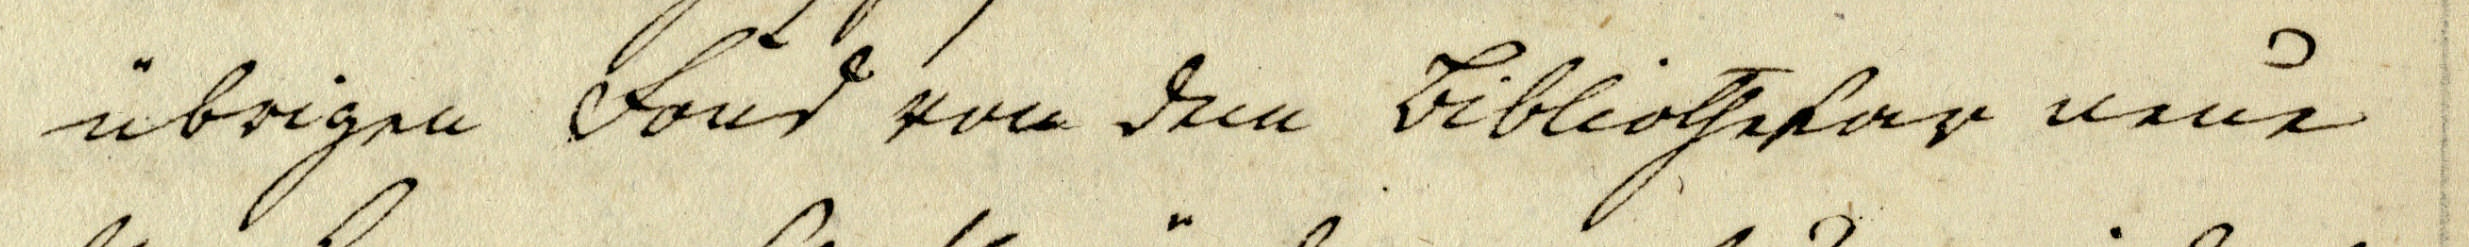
übrigen Fond von dem Bibliothekar neue
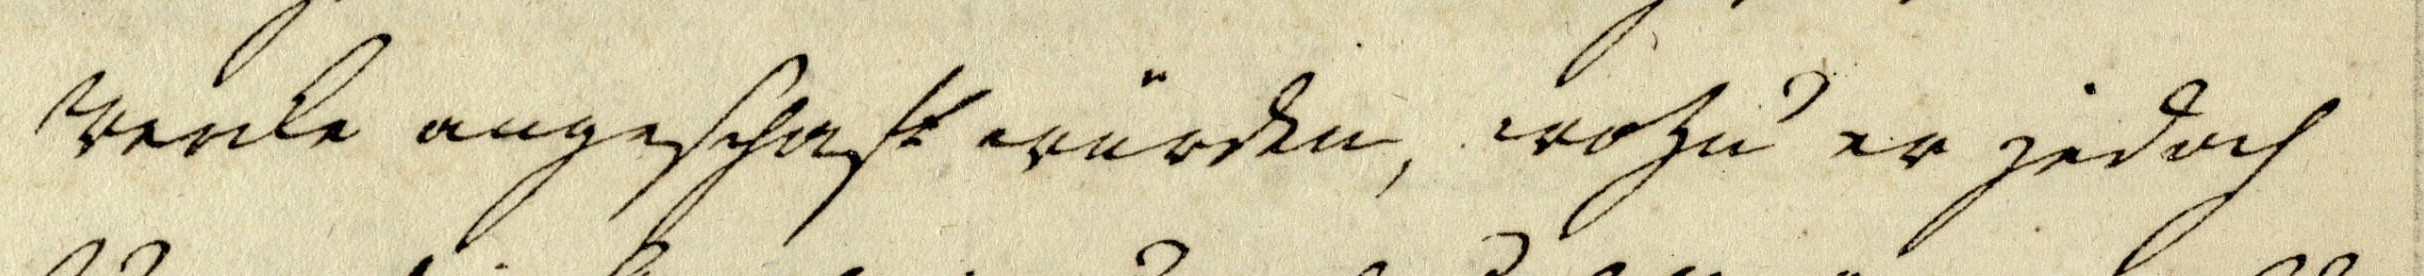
Wercke angeschaft würden, wozu er jedoch
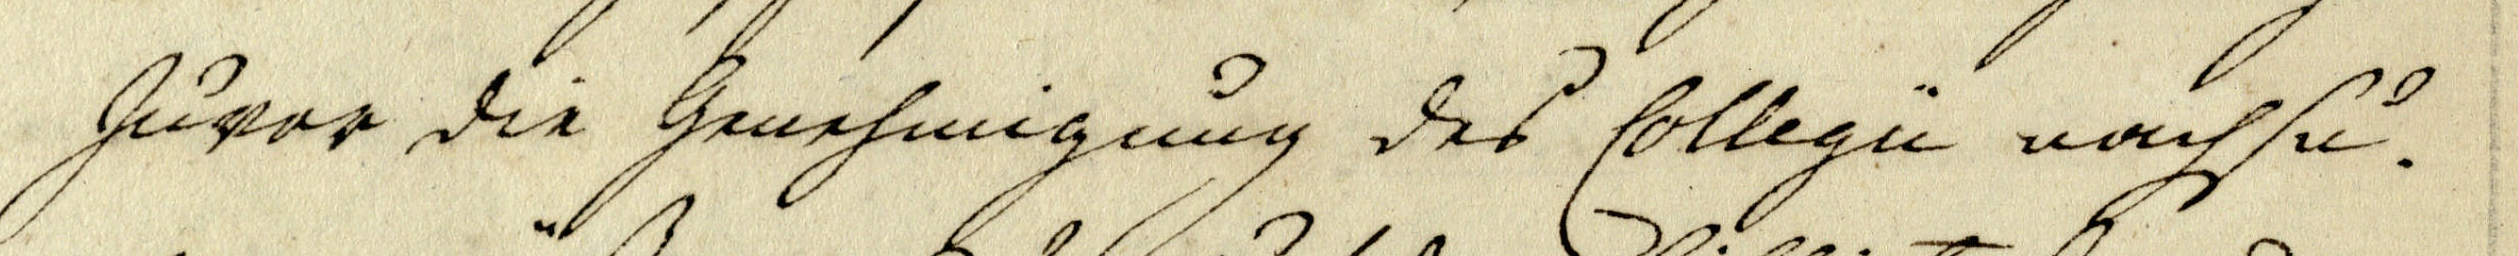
zuvor die Genehmigung des Collegii nachsu¬
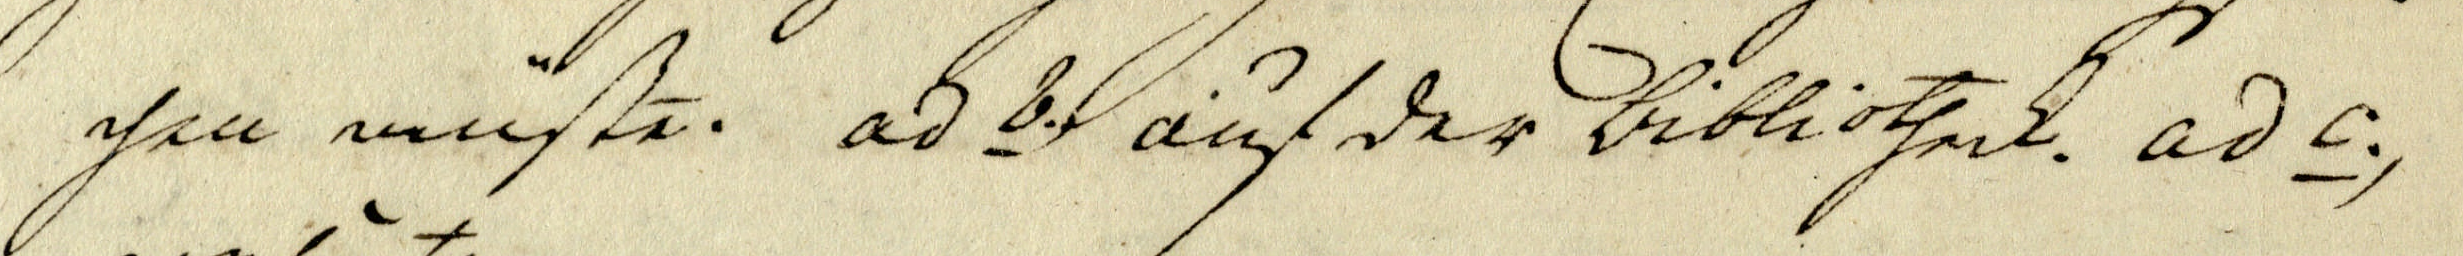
chen müßte. ad b., auf der Bibliotheck. ad c.,
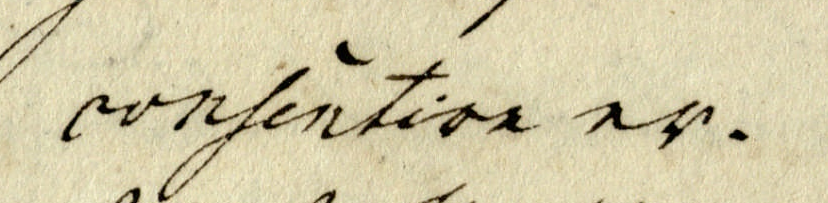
consentire er.
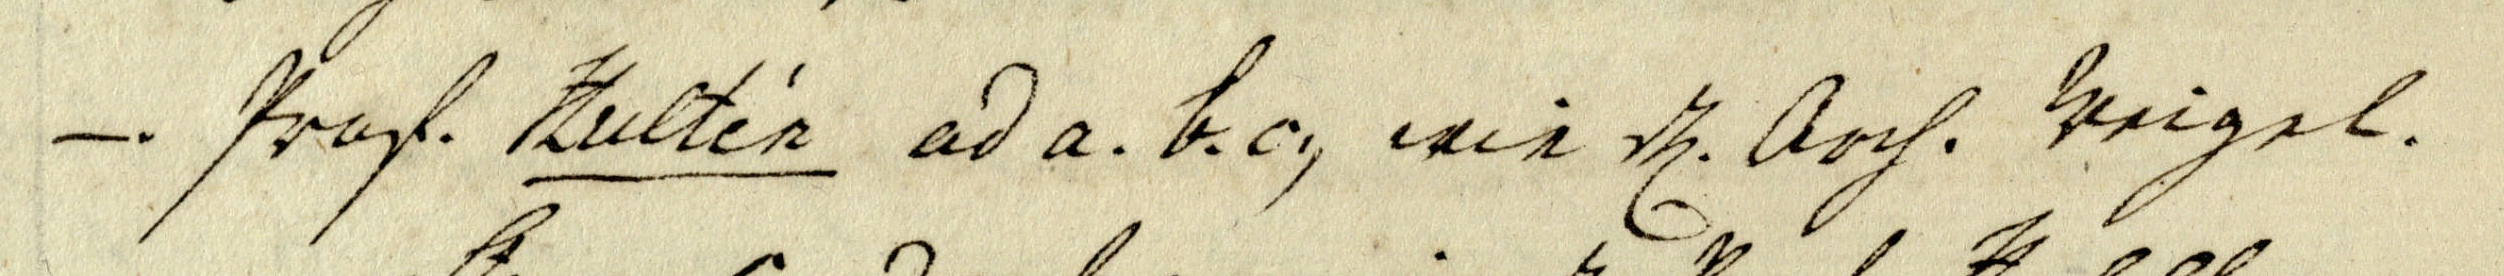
Prof. Hultén ad a. b. c, wie dh. Arch. Weigel.
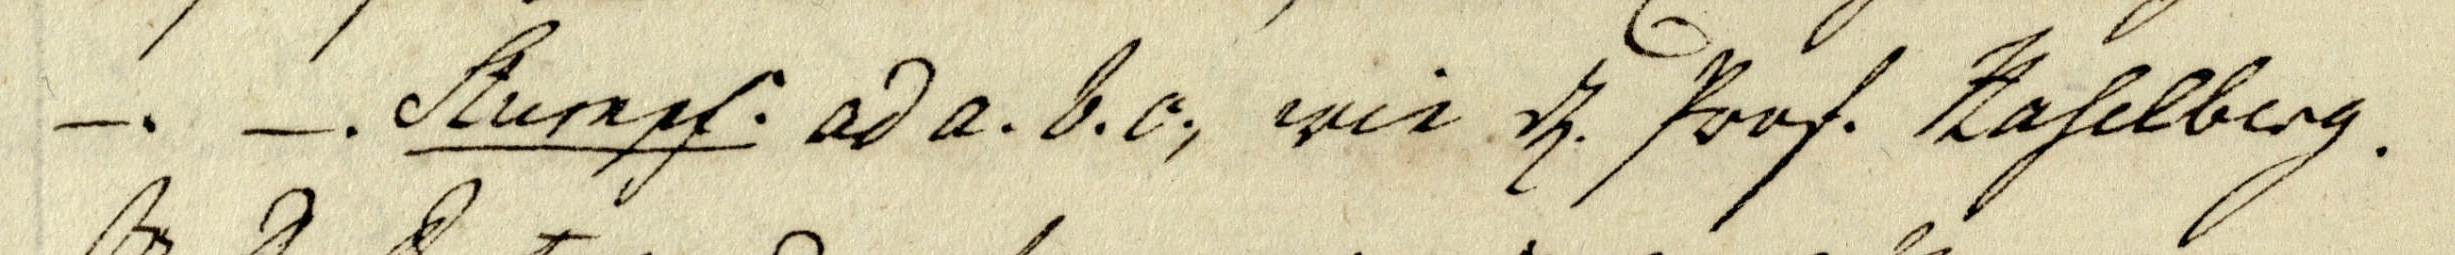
Stumpf. ad a. b. c, wie dh. Prof. Haselberg.
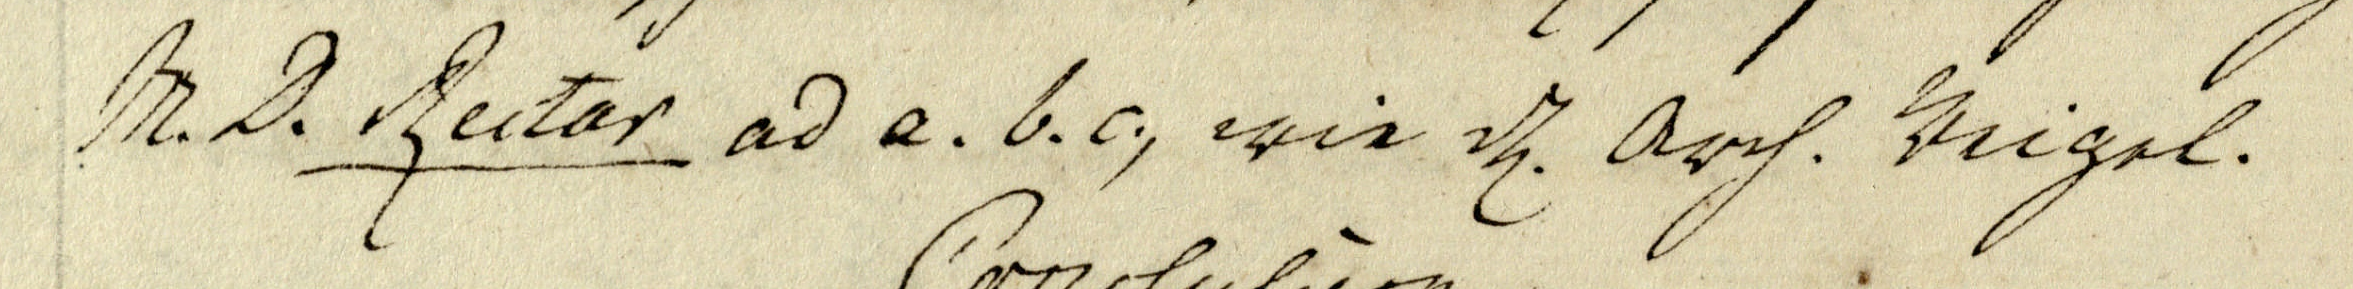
M. D. Rector ad a. b. c., wie dh. Arch. Weigel.
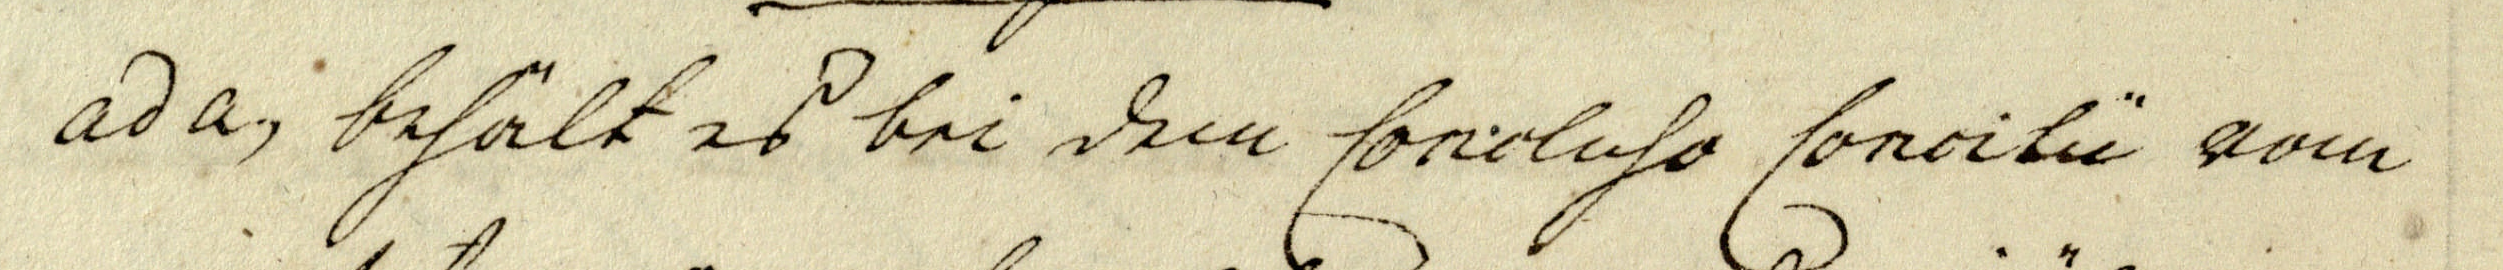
ad a, behält es bei dem Concluso Concilii vom
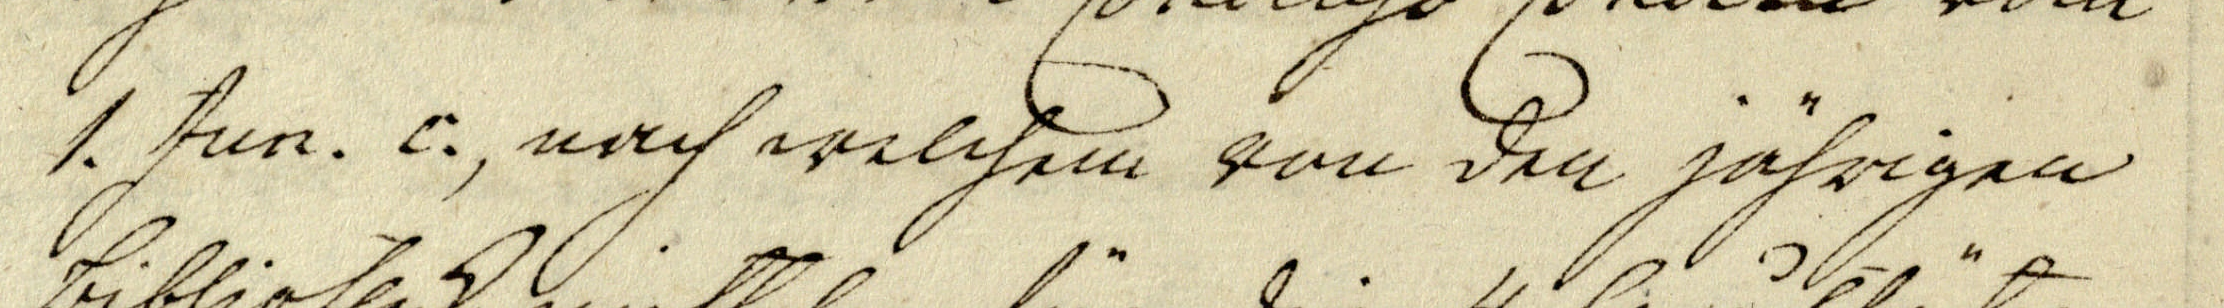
1. Jun. c., nach welchem von den jährigen
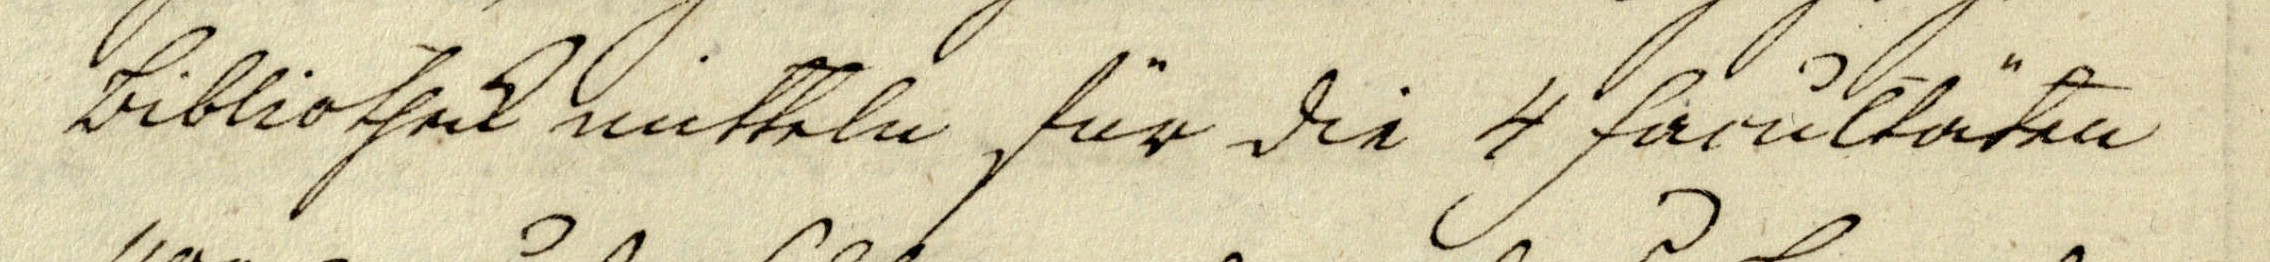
Bibliotheckmitteln für die 4 Facultäten
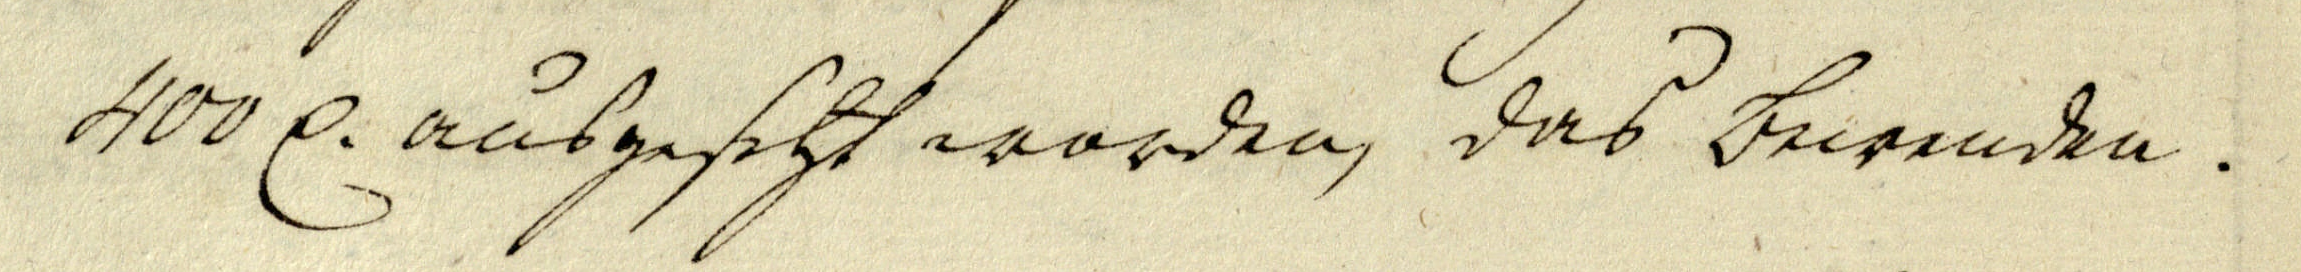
400 l. ausgesetzt worden, das Bewenden.
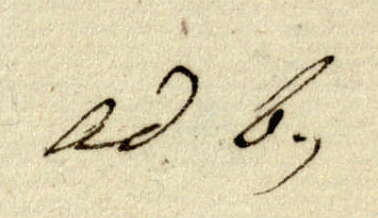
ad b.,
